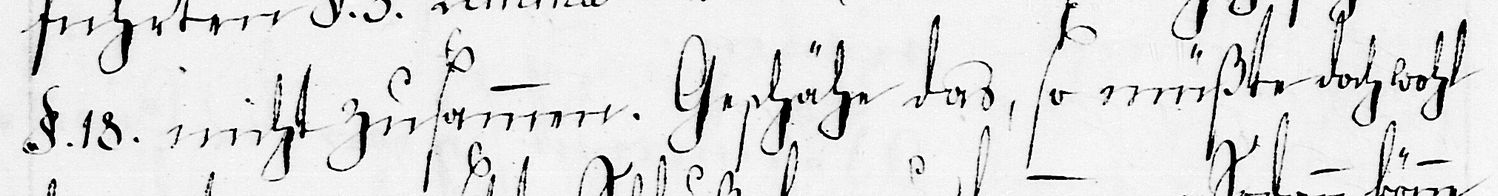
§. 18. nicht zusammen. Geschähe das, so müßte doch wohl
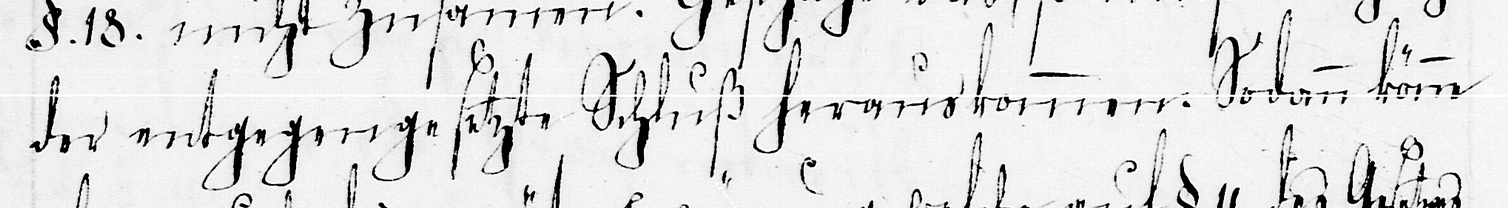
der entgegengesetzte Schluß herauskommen. Sodann könne
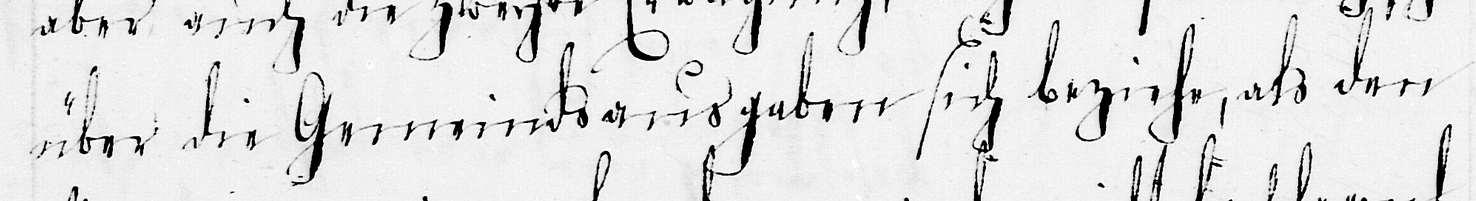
über die Gemeindsausgaben sich beziehe, als den
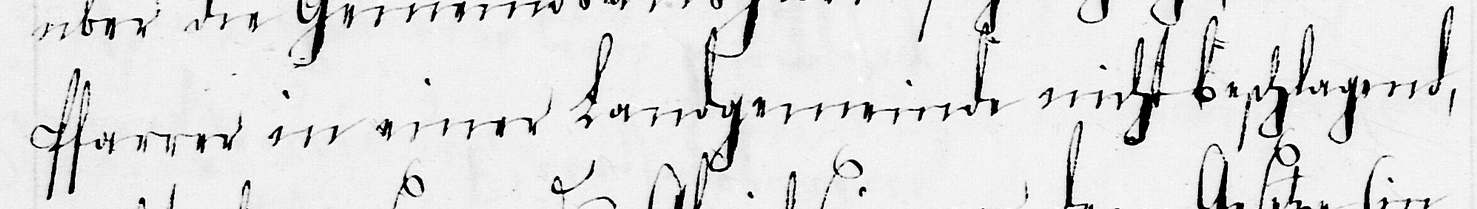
Pfarrer in einer Landgemeinde nicht beschlagend,
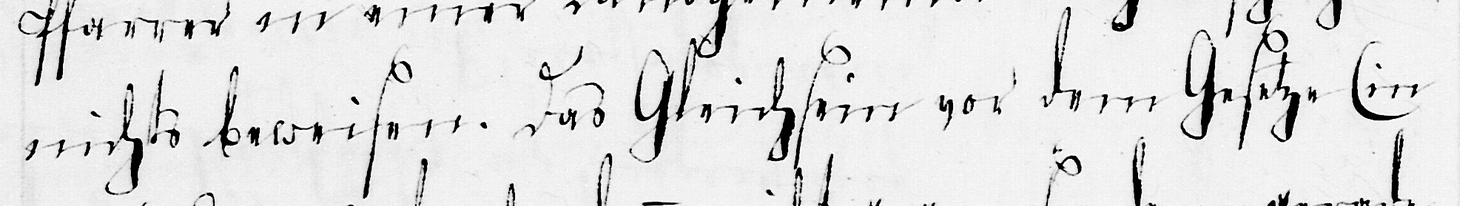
nichts beweisen. Das Gleichsein vor dem Gesetze (in
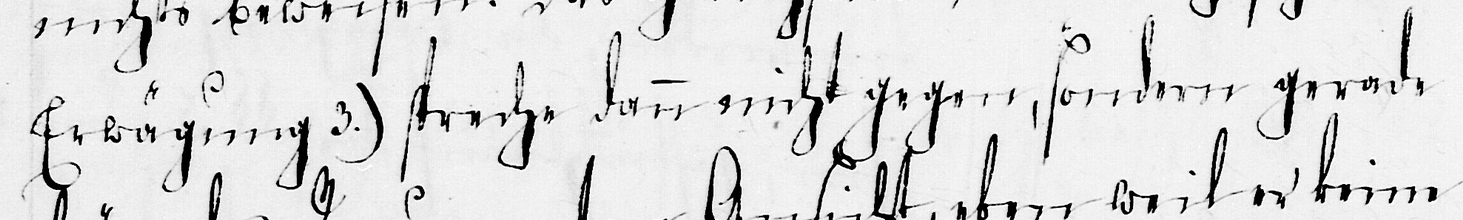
Erwägung 3.) spreche dann nicht gegen, sondern gerade
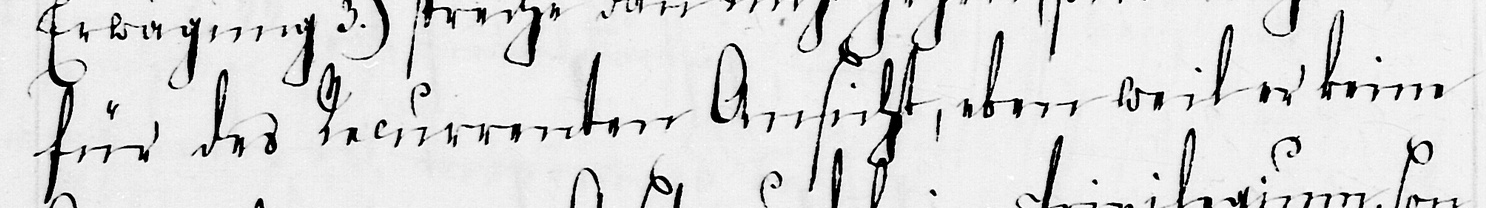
für des Recurrenten Ansicht, eben weil er keine
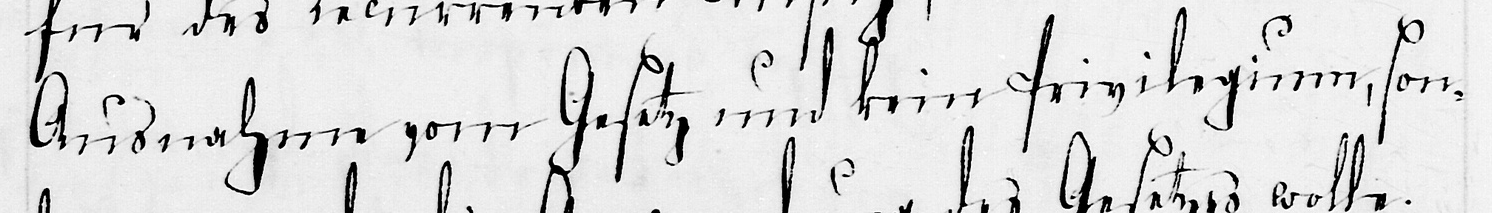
Ausnahme vom Gesetz und kein Privilegium, son¬
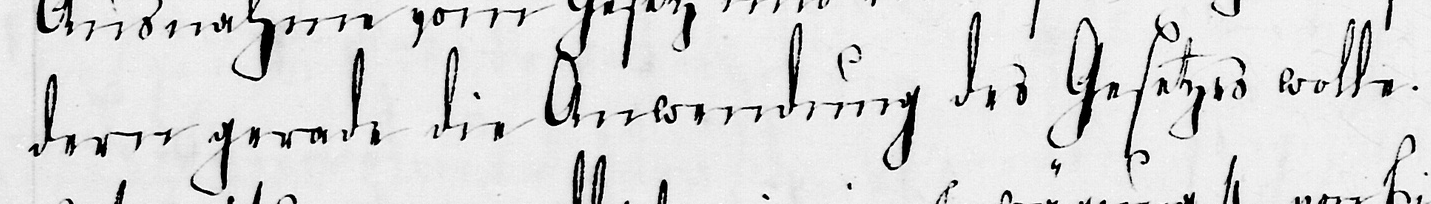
dern gerade die Anwendung des Gesetzes woll¬
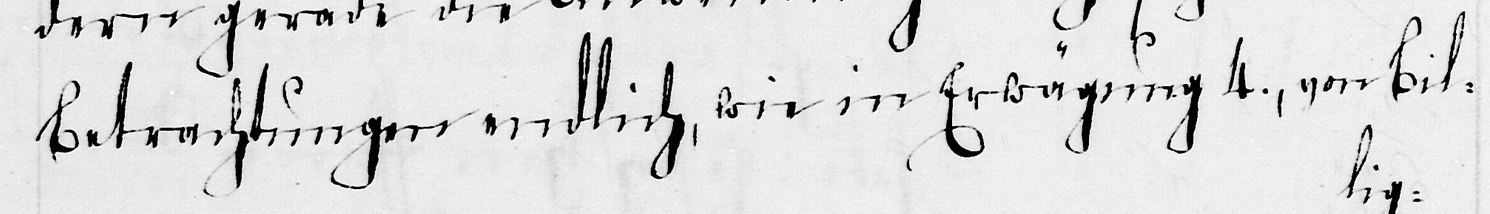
Betrachtungen endlich, wie in Erwägung 4., von Bil-
